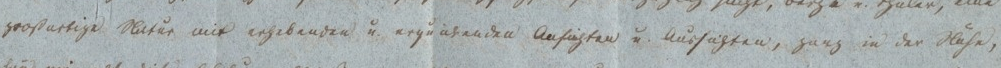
großartige Natur mit erhebenden u. erquickenden Ansichten u. Aussichten, ganz in der Nähe,
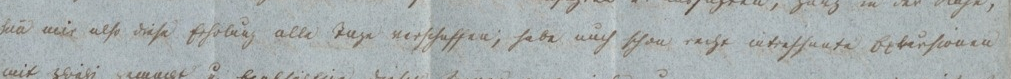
kann mir also diese Erholung alle Tage verschaffen, habe auch schon recht intressante Exkursionen
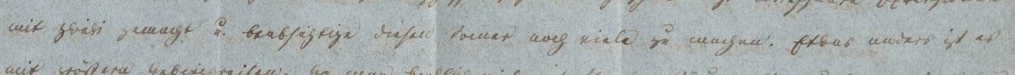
mit Zwicki gemacht u. beabsichtige diesen Sommer noch viele zu machen. Etwas anders ist es
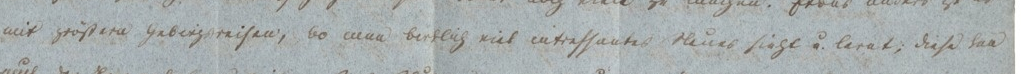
mit größern Gebirgsreisen, wo man wirklich viel intressantes Neues sieht u. lernt; diese kann
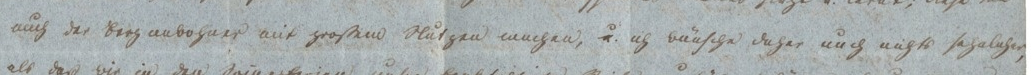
auch der Berganwohner mit großem Nutzen machen, u. ich wünsche daher auch nichts sehnlicher,
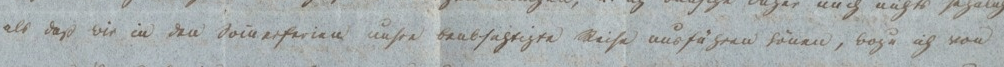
als daß wir in den Sommerferien unsre beabsichtigte Reise ausführen könen, wozu ich von
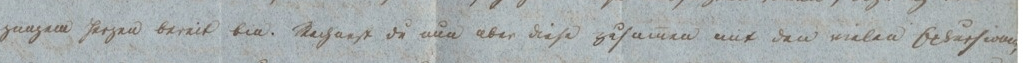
ganzem Herzen bereit bin. Rechnest du nun aber diese zusammen mit den vielen Exkursionen,
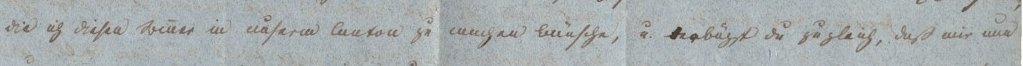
die ich diesen Sommer in unserm Canton zu machen wünsche, u. erwägst du zugleich, daß mir nun
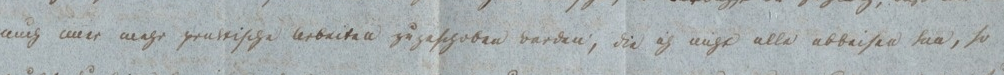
auch immer mehr praktische Arbeiten zugeschoben werden, die ich nicht alle abweisen kann, so
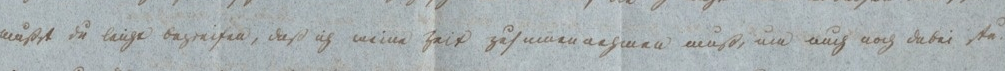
mußt du leicht begreifen, daß ich meine Zeit zusammennehmen muß, um auch noch dabei stu-
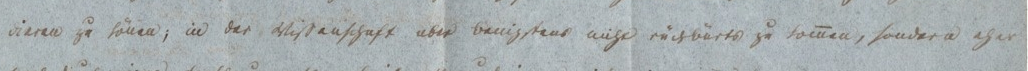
dieren zu können; in der Wissenschaft aber wenigstens nicht rückwärts zu kommen, sondern eher
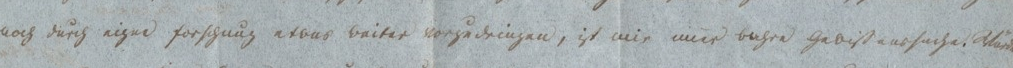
noch durch eigne Forschung etwas weiter vorzudringen, ist mir immer wahre Gewissenssache. Würde
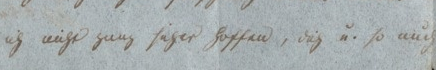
ich nicht ganz sicher hoffen, dich u. so auch
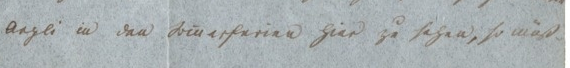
Aepli in den Sommerferien hier zu sehen, so müß-
